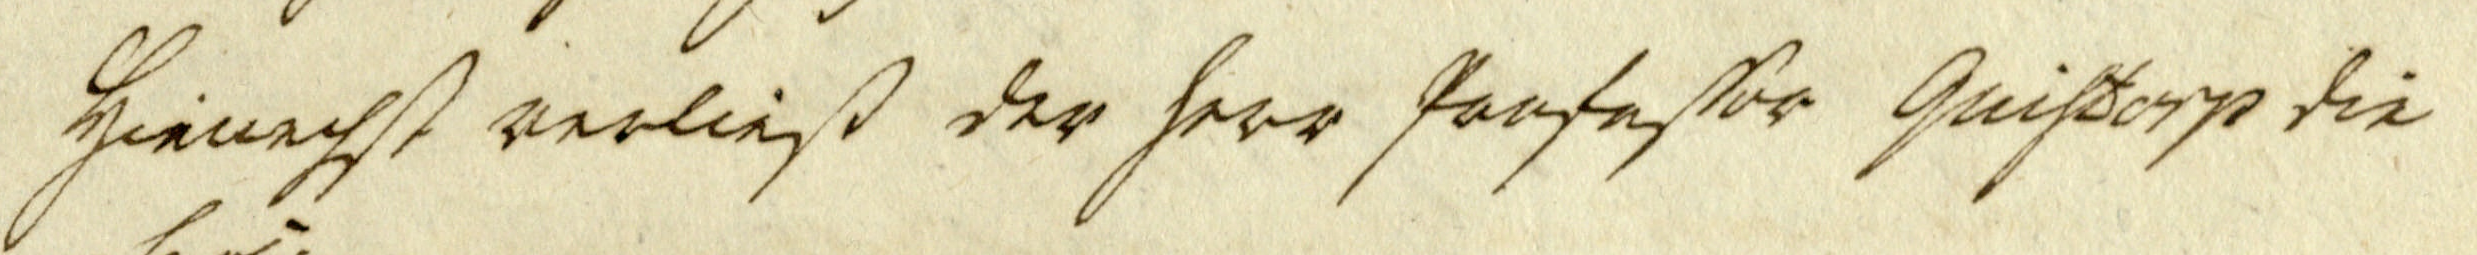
Hienechst verließ der herr Professor Quistorp die
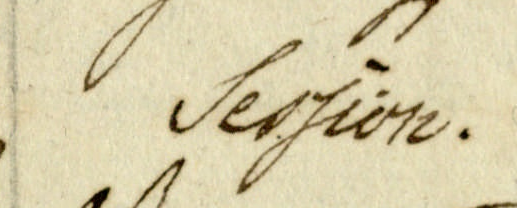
Session.
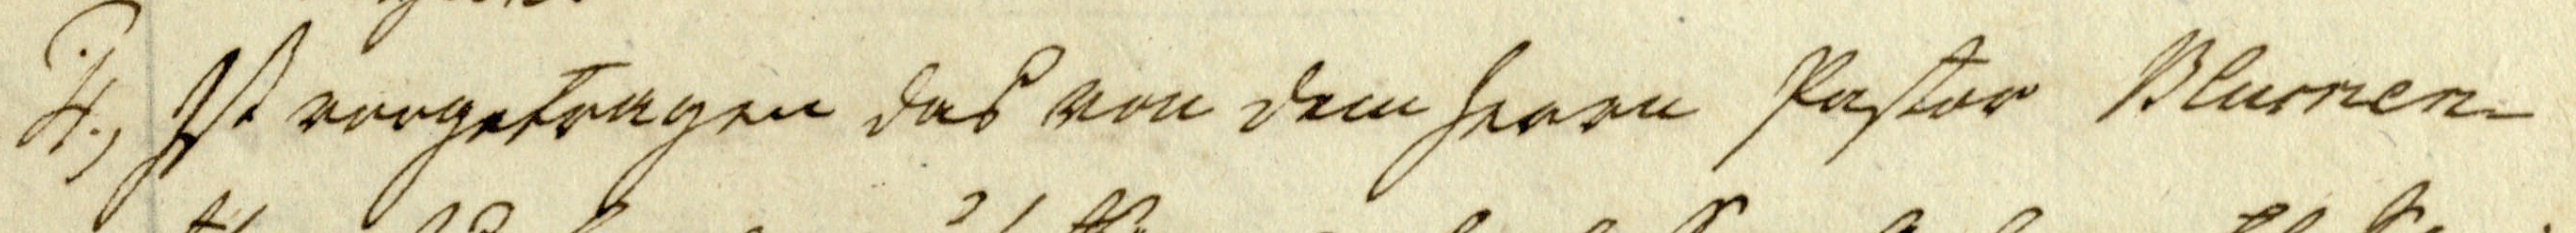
4., Ist vorgetragen das von dem herrn Pastor Blumen¬
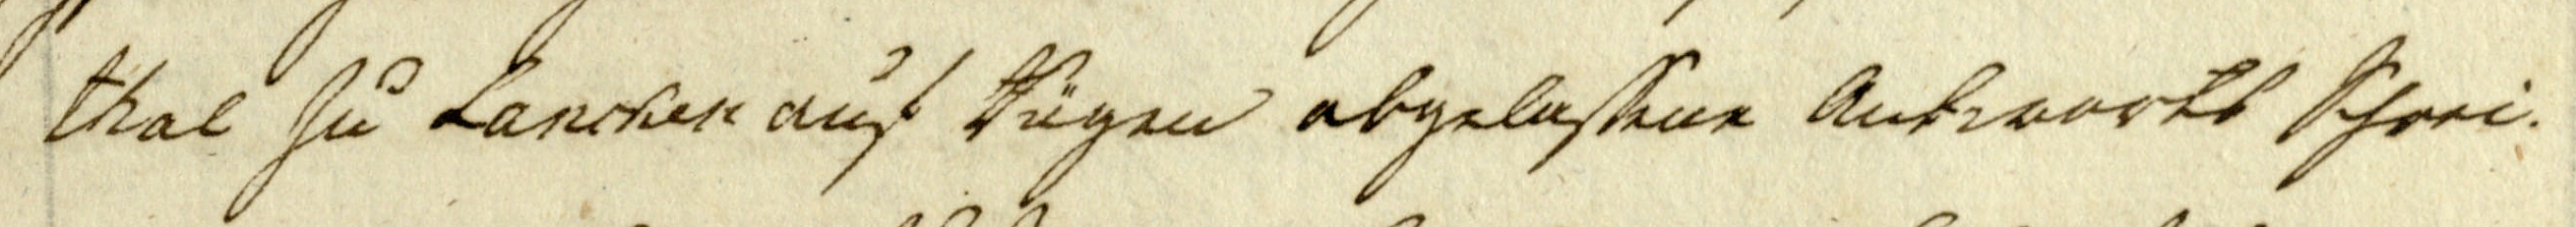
thel zu Lancken auf Rügen abgelassene Antworts Schrei¬
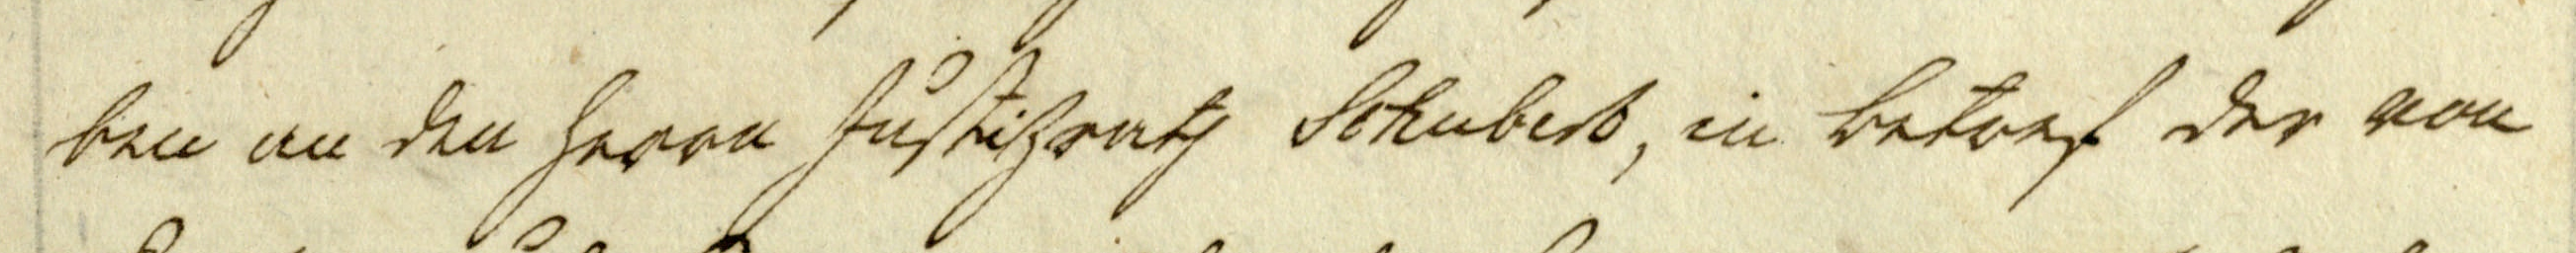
ben an den herrn Justizrath Schubert, in Betref der von
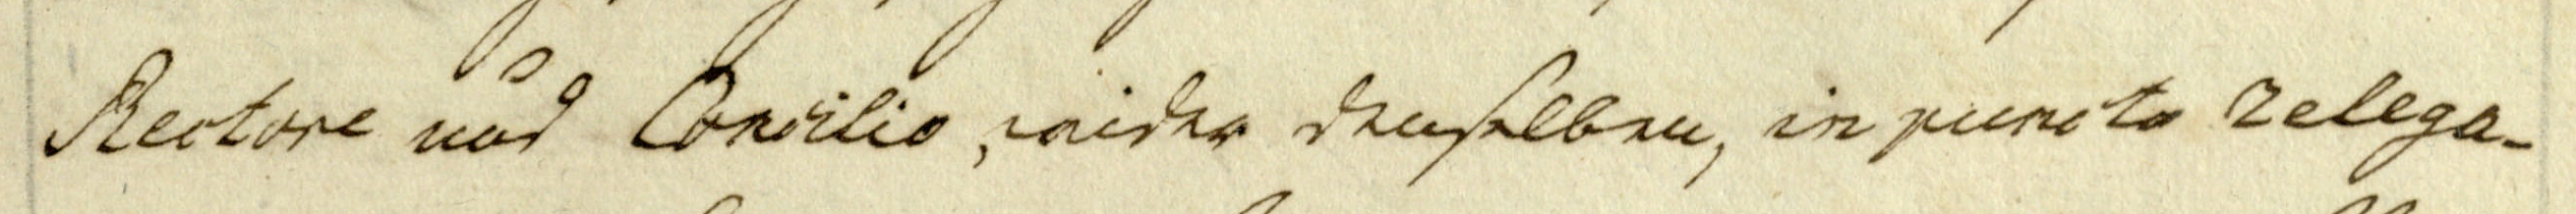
Rectore und Concilio, wider denselben, in puncto relega¬
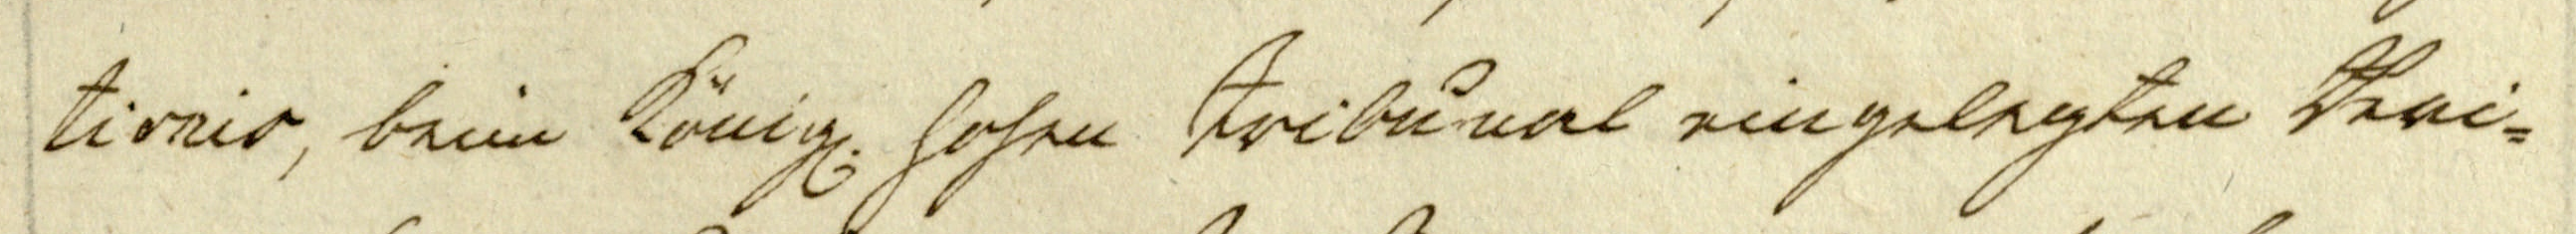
tionis, beim Königl. hohen Tribunal eingelegten Revi¬
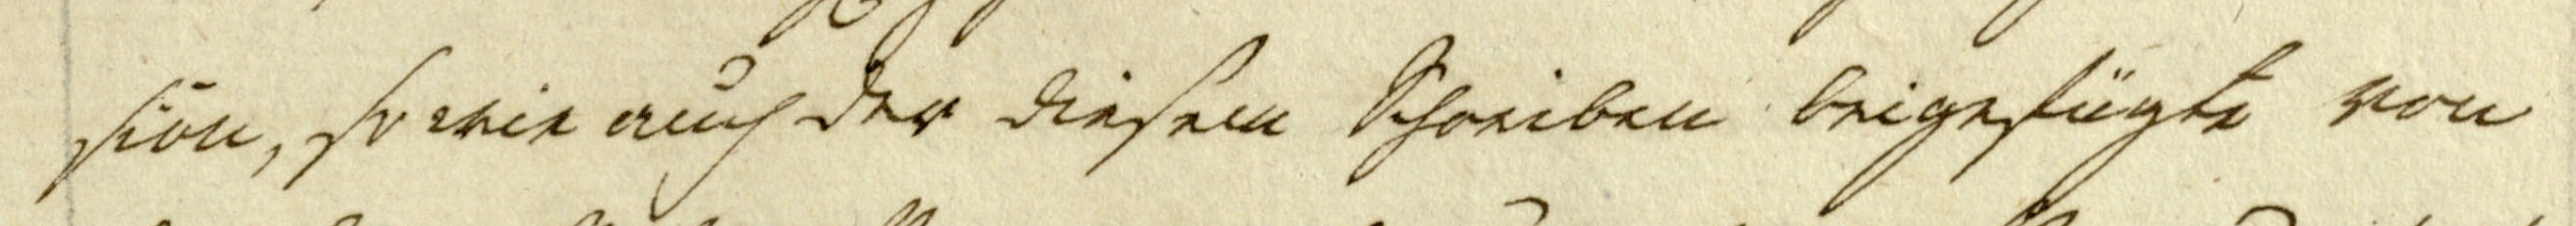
sion,so wie auch der diesem Schreiben beigefügte von
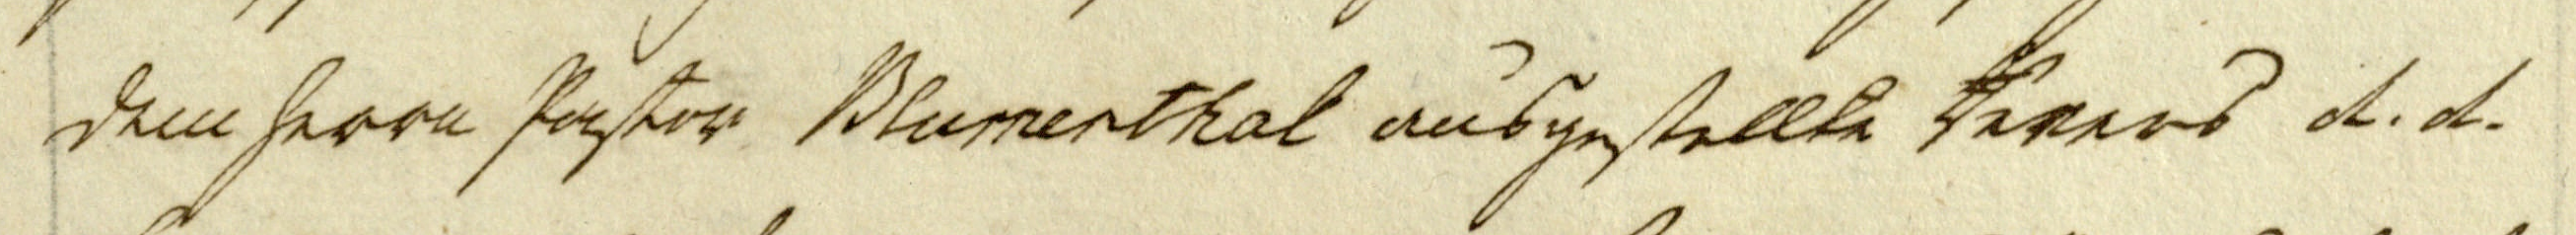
dem herrn Pastor Blumenthal ausgestellte Revers d. d.
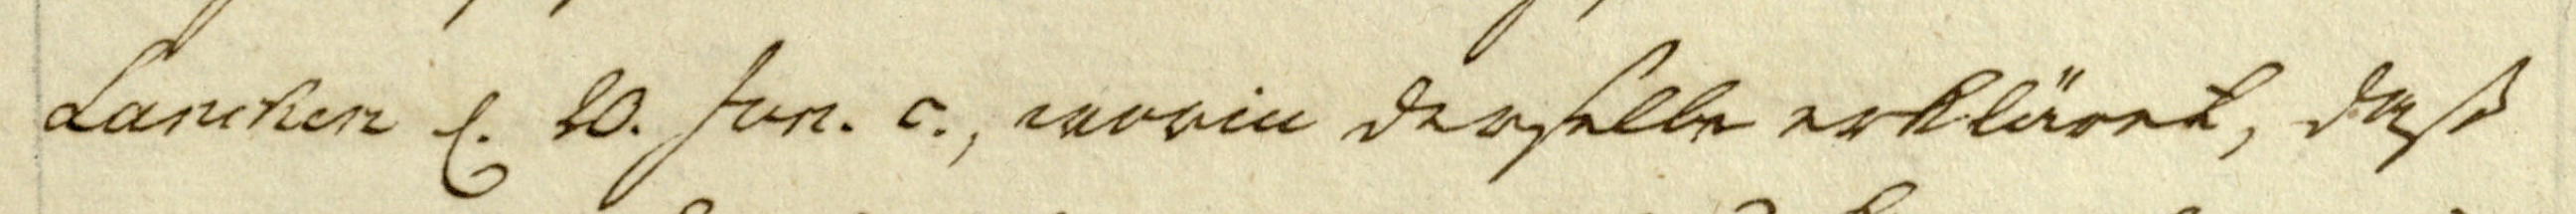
Lancken l. 20. Jun. c., worin derselbe erkläret, daß
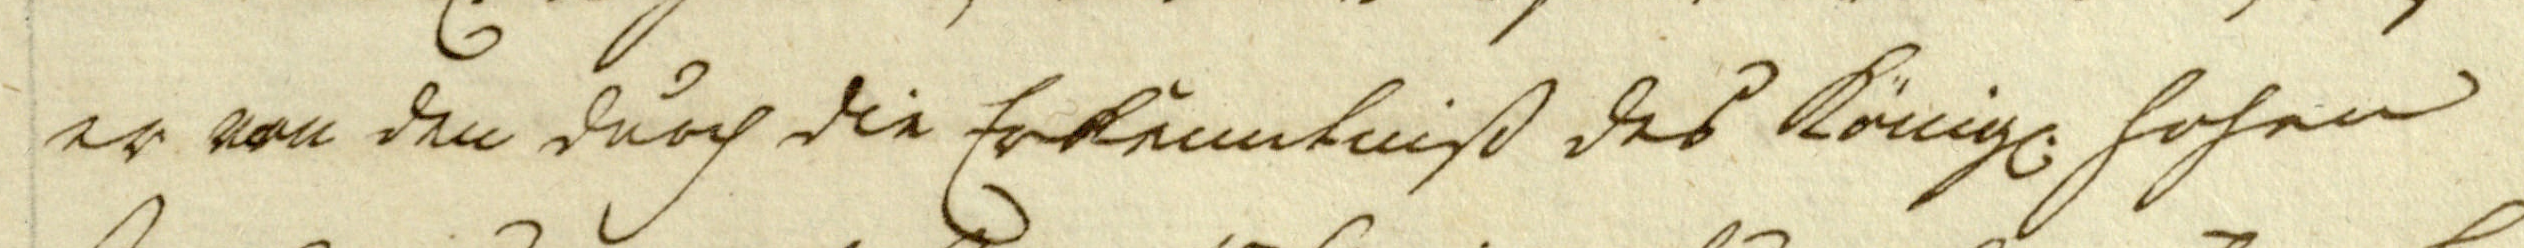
er von den durch die Erkenntniß des Königl. hohen
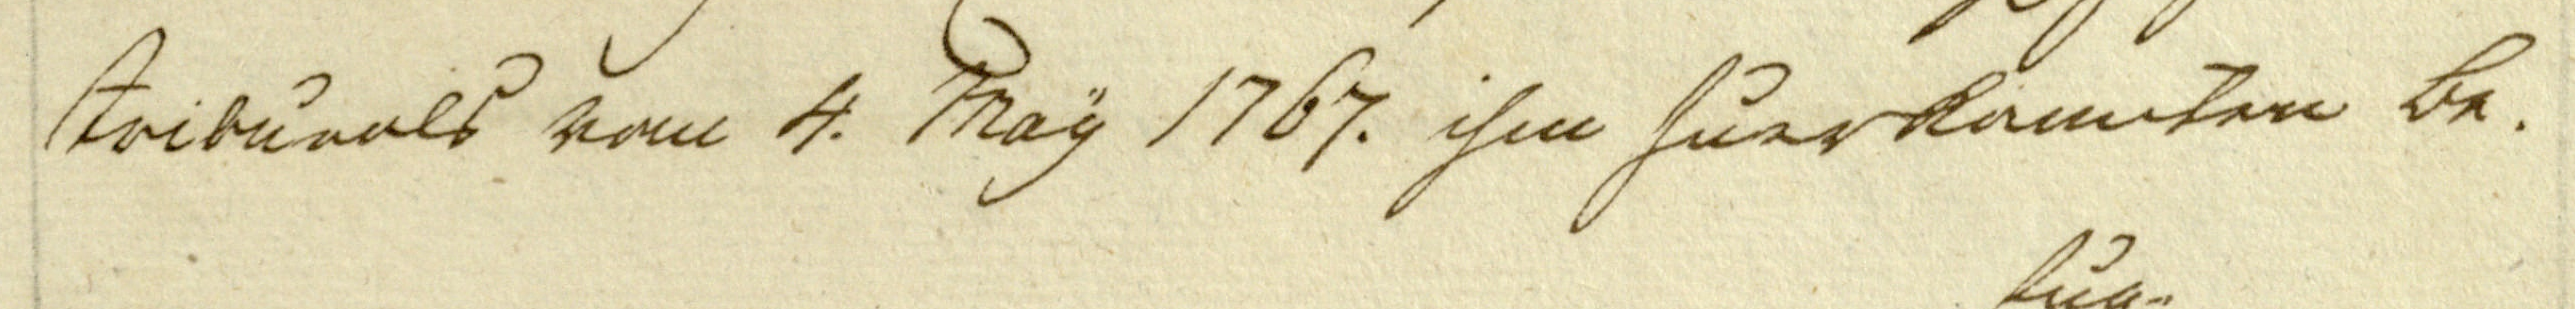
Tribunals vom 4. Maÿ 1767. ihm zuerkannten Be¬
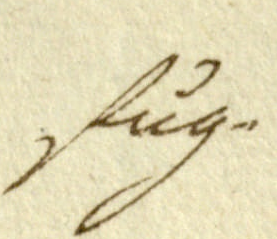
fug.
